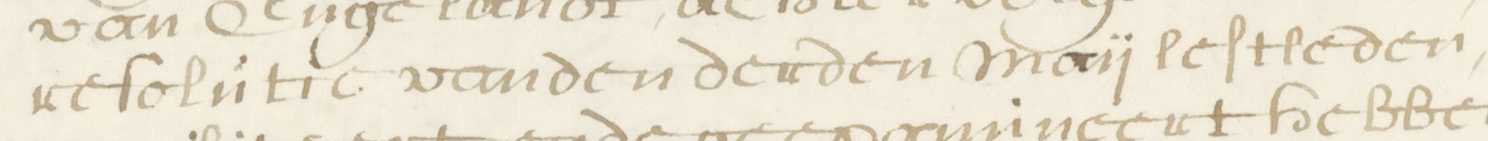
resolutie vanden derden maij lestleden,
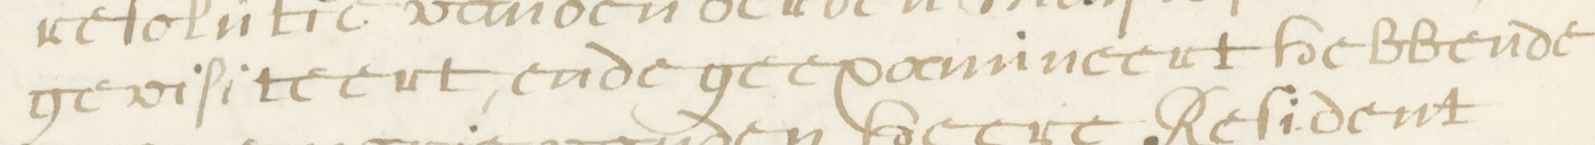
gevisiteert, ende geexamineert hebbende
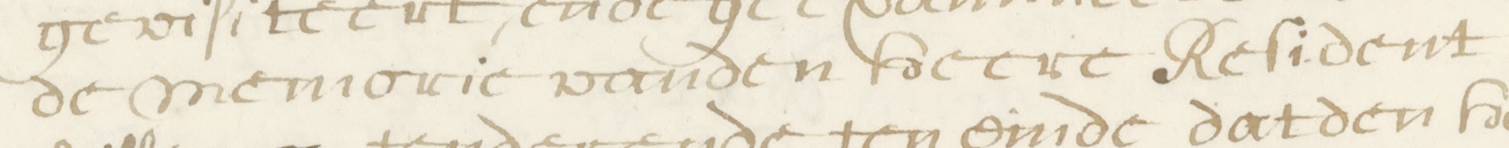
de memorie vanden heere Resident
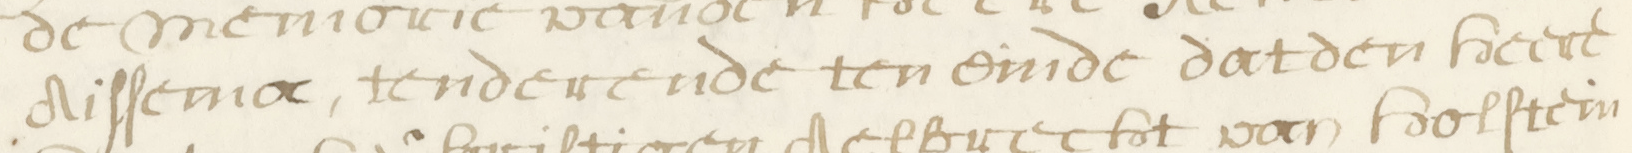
Aissema, tenderende ten einde dat den heere
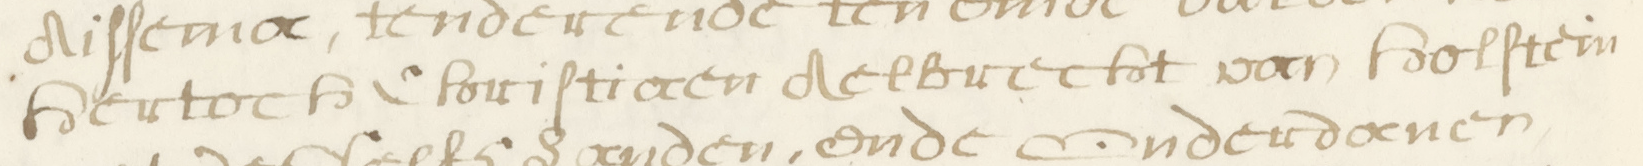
hertoch Christiaen Aelbrecht van holstein
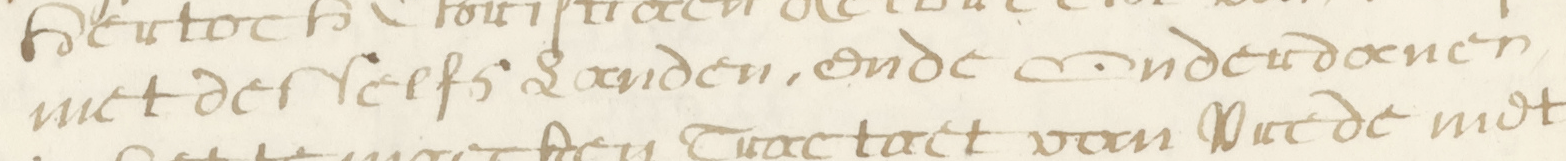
met desselfs Landen, ende Onderdanen
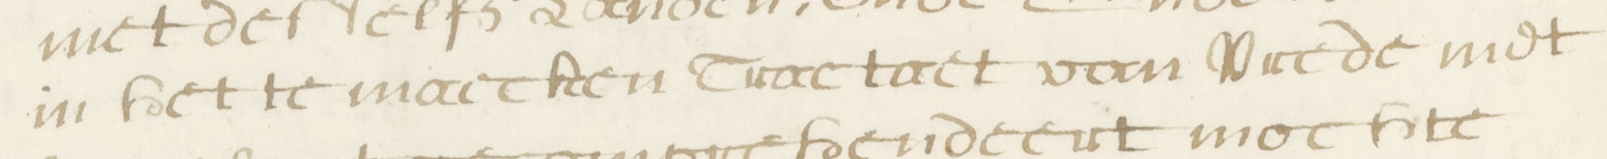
in het te maecken Tractaet van Vrede met
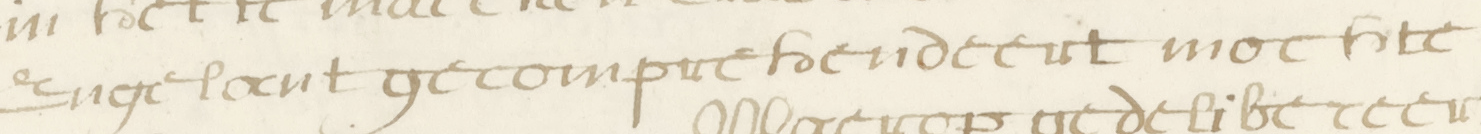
Engelant gecomprehendeert mochte
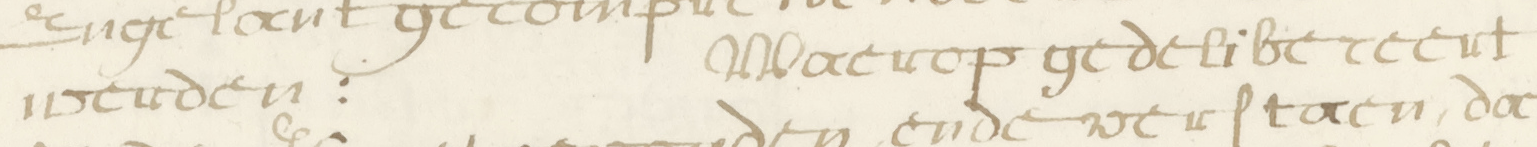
werden: Waerop gedelibereert
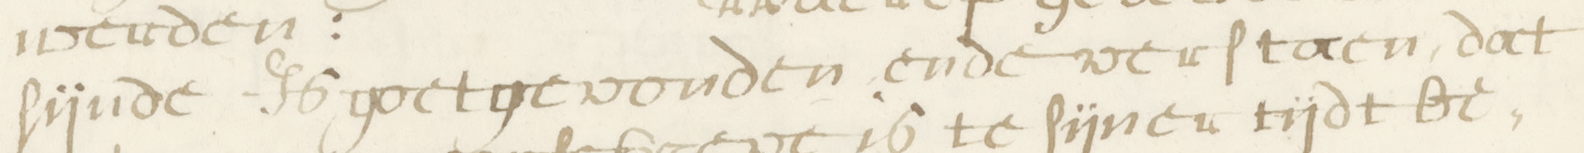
sijnde, Is goetgevonden ende verstaen, dat
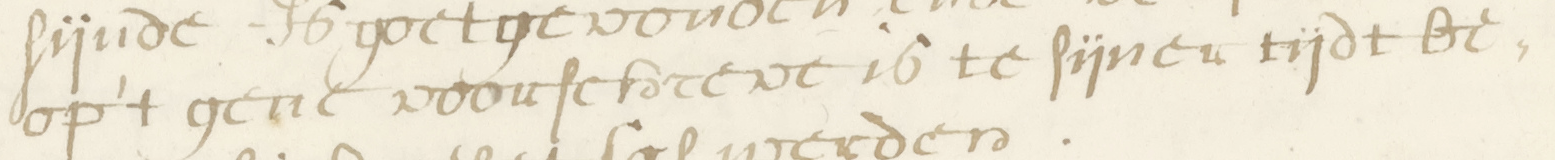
op't gene voorschreve is te sijner tijdt be,,
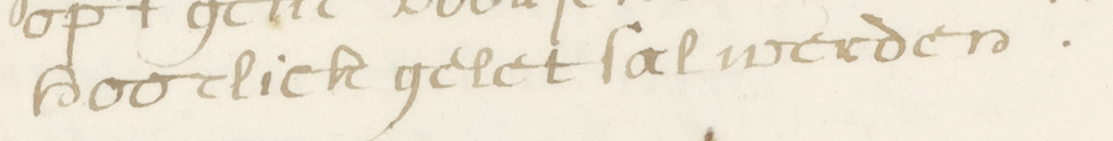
hoorlick gelet sal werden.
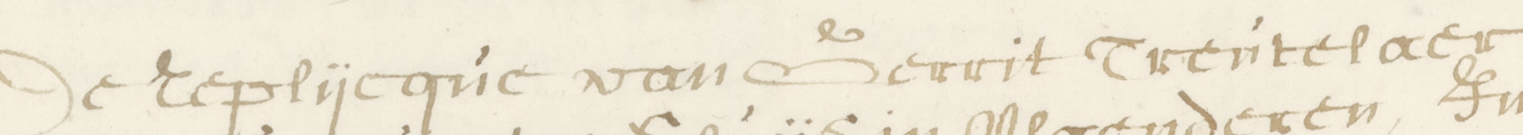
De replijcque van Gerrit Treutelaer
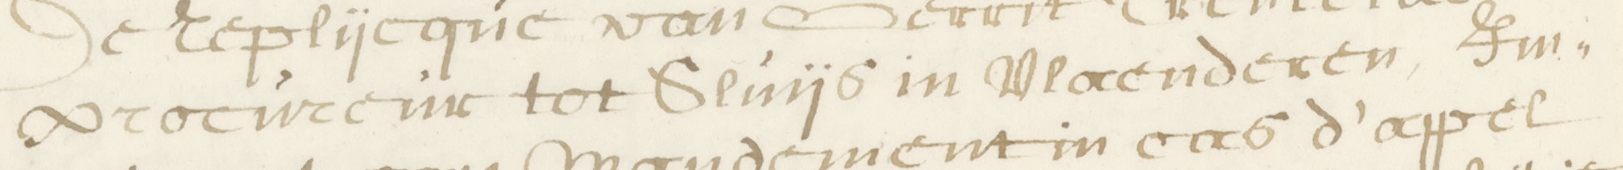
Procureur tot Sluijs in Vlaenderen, Im,,
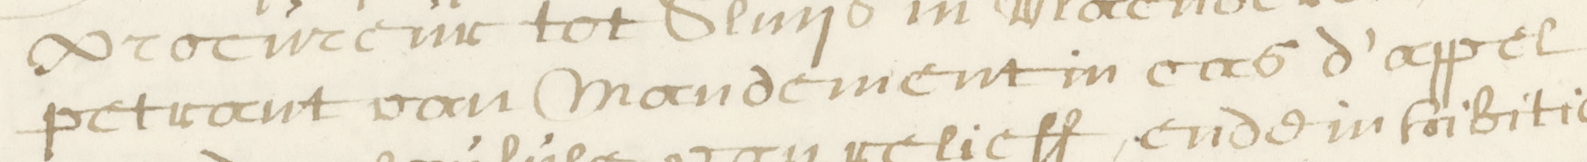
petrant van Mandement in cas d'appel
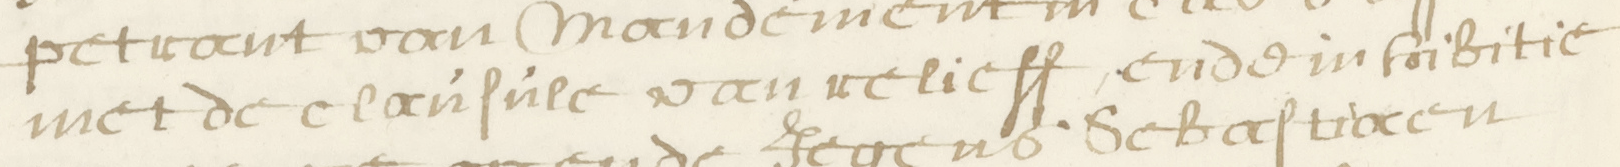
met de clausule van relieff, ende inhibitie
